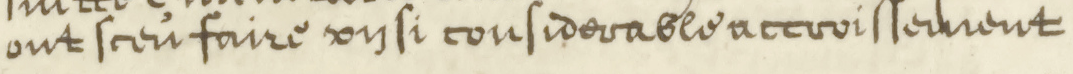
ont sceu faire vn si considerable accroissement.
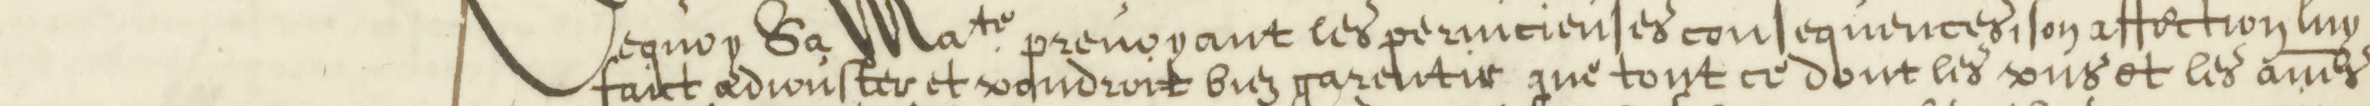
De quoy Sa Mate. preuoyant les pernicieuses consequences, son affection luy
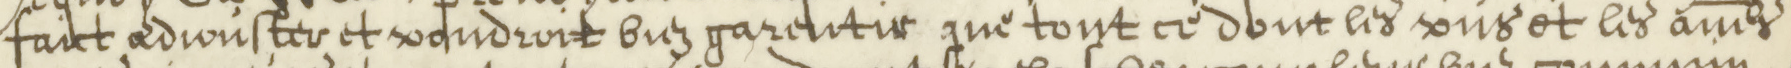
faict adiouster et voudroit bien garentir que tout ce dont les vns et les aues
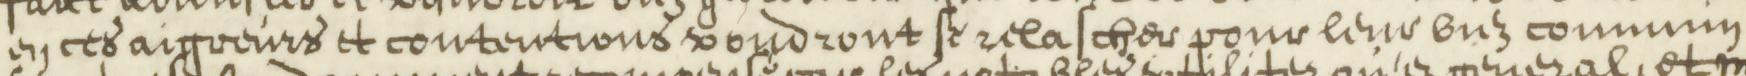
en ces aigreurs et contentions voudront se relascher pour leur bien commun
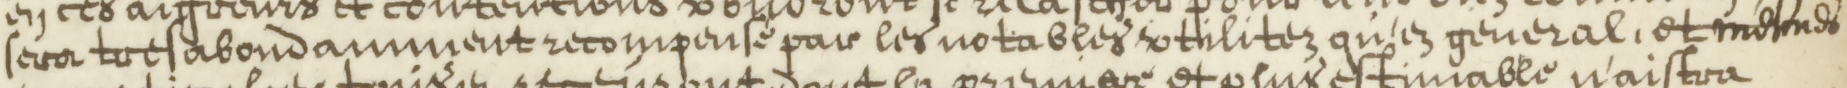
sera tres abondamment recompense par les notables utilitez qu‛en general, et mesmes
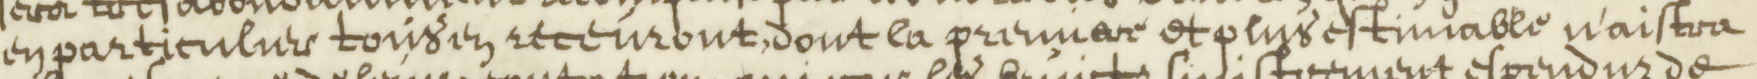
en particulier tous en receuront, dont la premiere et plus estimable n‛aistra
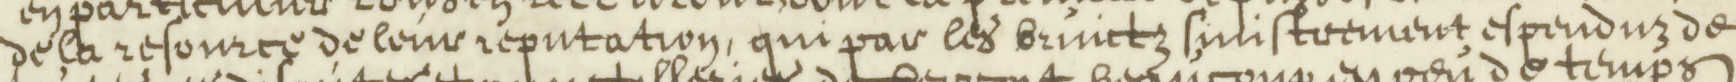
de la resource de leur reputation, qui par les bruictz sinistrement espenduz de
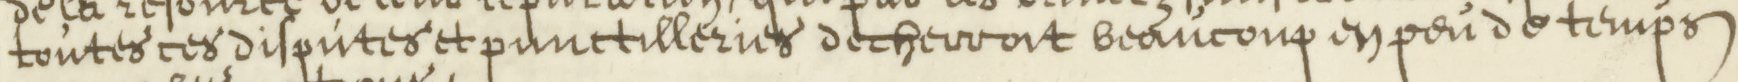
toutes ces disputes et punctilleries decherroit beaucoup en peu de temps
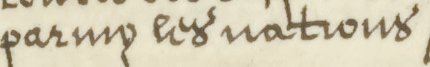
parmy les nations.
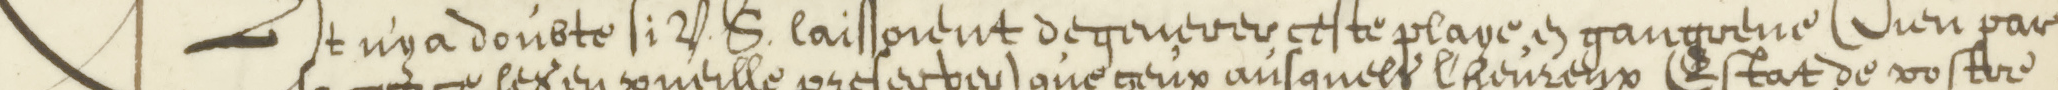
Et n‛y a doubte si V.S. laissoient degenerer ceste playe en gangrene (Dieu par
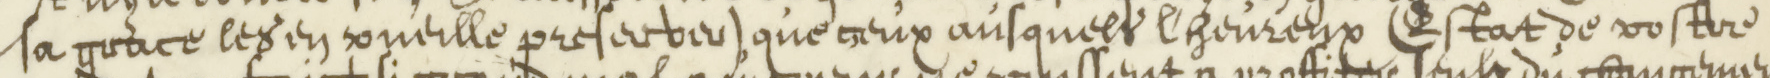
sa grace les en vueille preserver) que ceux ausquels l‛heureux Estat de vostre
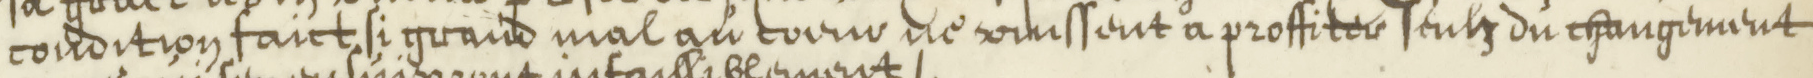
condition faict si grand mal au coeur ne souffent a proffiter seulz du changement
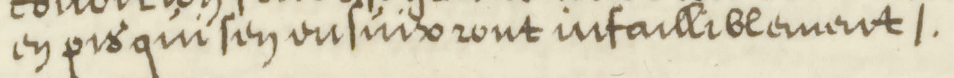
en pis qui sen ensuivront infailliblement.
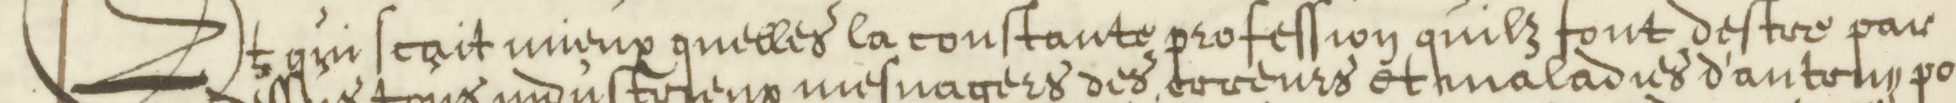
Et qui scait mieux quelles la constante profession quilz font destre par
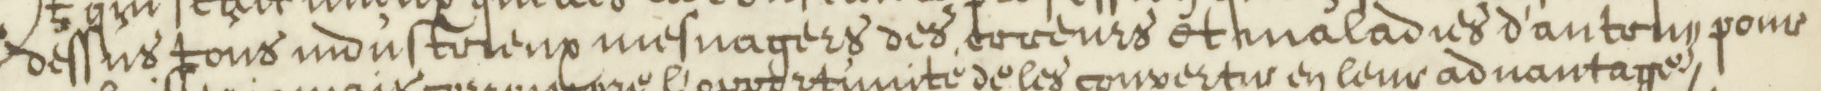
dessus tous industrieux mesnagers des erreurs et maladies d'autrui pour
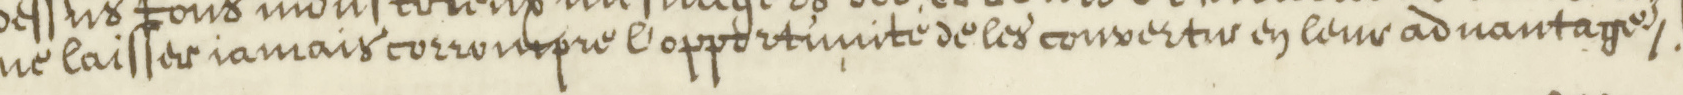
ne laisser iamais corrompre l‛opportunité de les convertir en leur aduantage.
